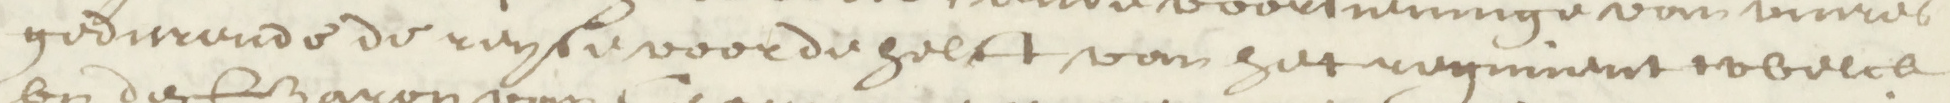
gedurende de reyse voorde helft van het regiment twelck
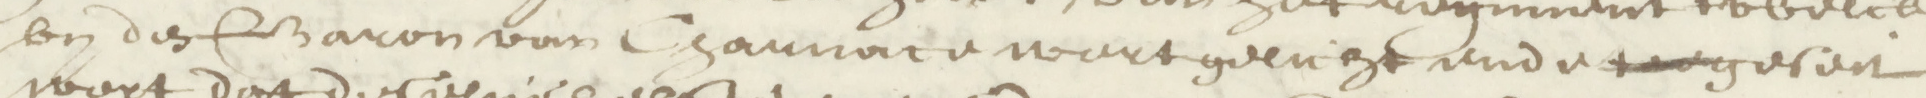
by den Baron van Charnace wert gelicht ende toegeseit
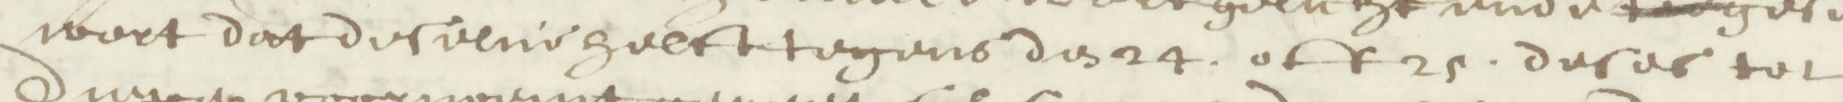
wert dat deselue helft tegens den 24. off 25. deses tot
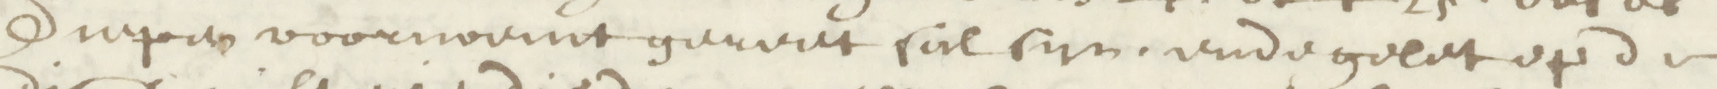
Diepen voornoemt gereet sal syn, ende gelet op de
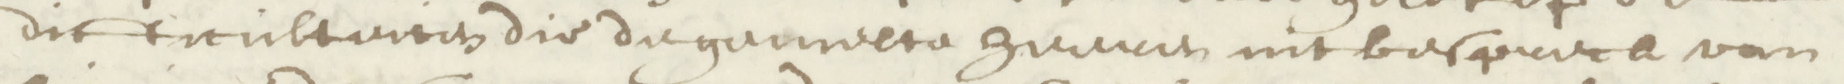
difficulteiten die de gemelte heeren int bespreck van
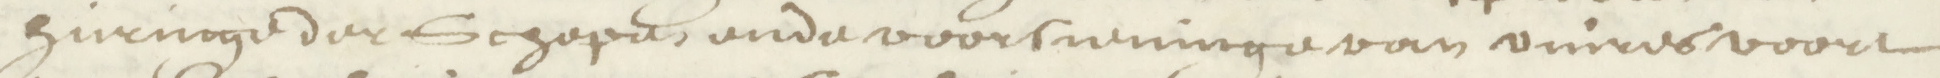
huringe der Schepen ende voorsieninge van viures voort
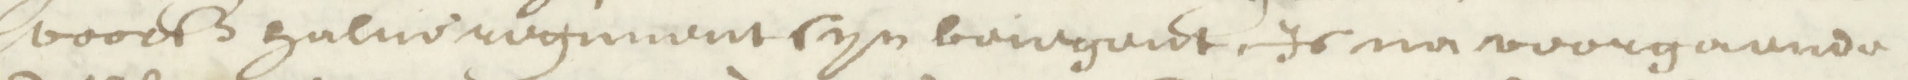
voors halue regiment syn beiegent, Is na voorgaende
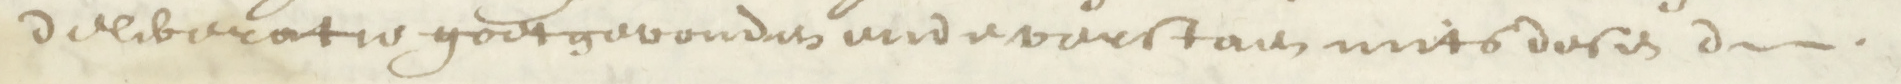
deliberatie goetgevonden ende verstaen mits desen den.
